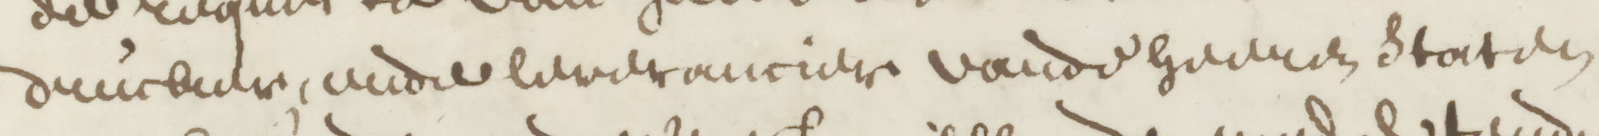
drucker, ende leverancier vande heeren Staten
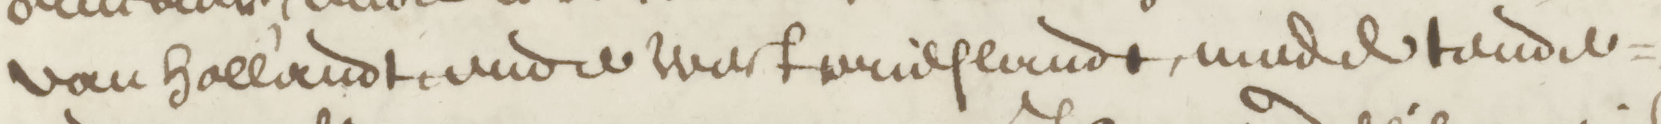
van hollandt, ende Westvrieslandt, mede tende=
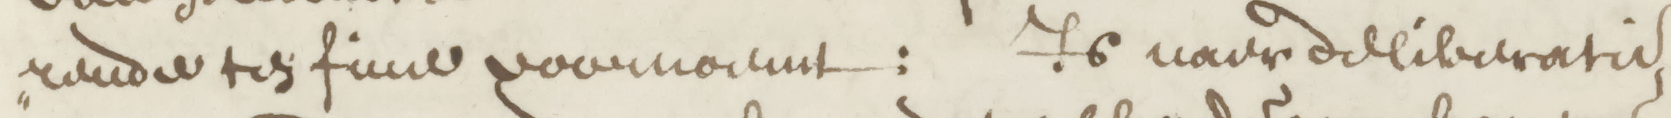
„rende ten fine voornoemt: Is naer deliberatie
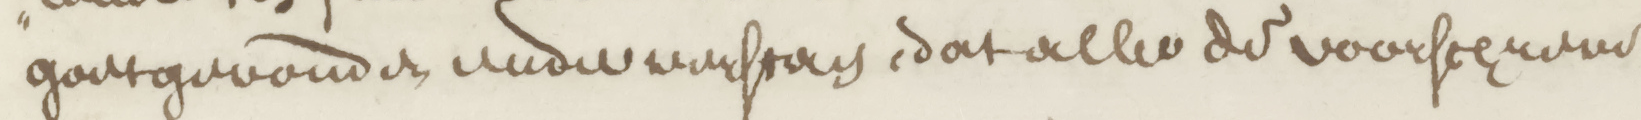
goetgevonden ende verstaen, dat alle de voorschreve
